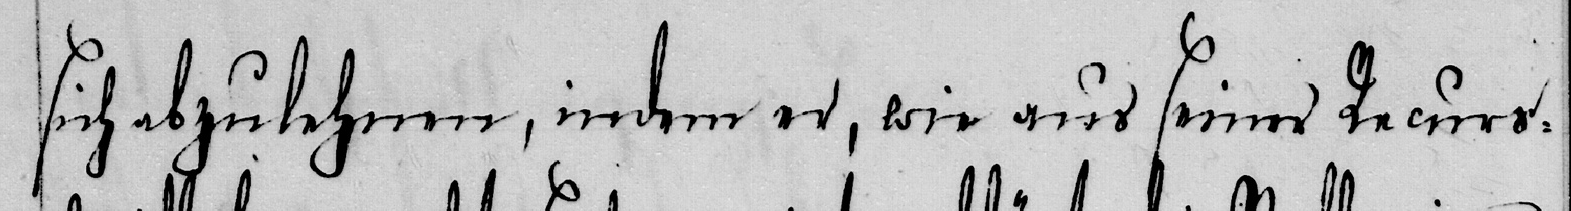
sich abzulehnen, indem er, wie aus seiner Recurs¬
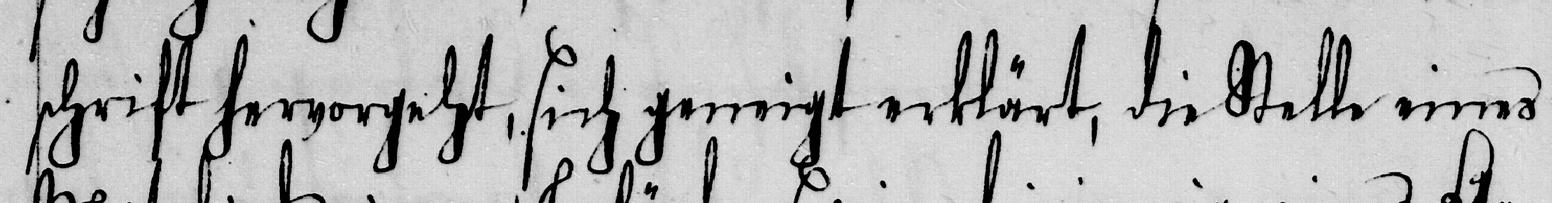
schrift hervorgeht, sich geneigt erklärt, die Stelle eines
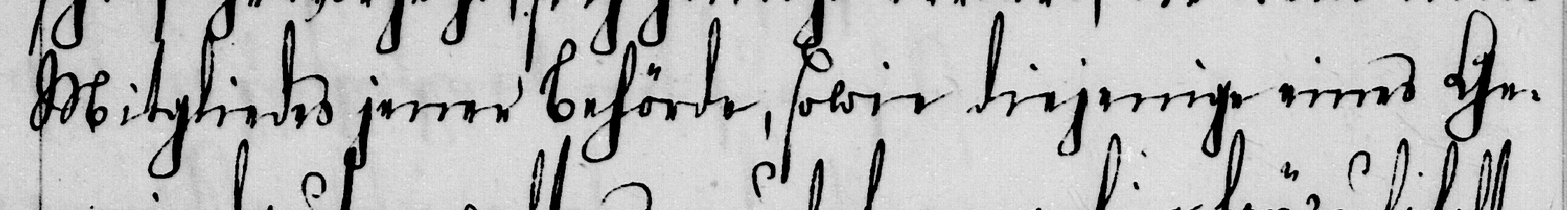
Mitgliedes jener Behörde, sowie diejenige eines Ge¬
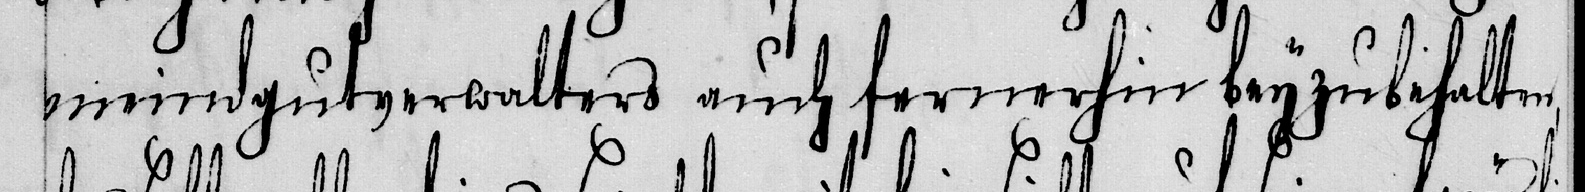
meindgutverwalters auch fernerhin beyzubehalten,
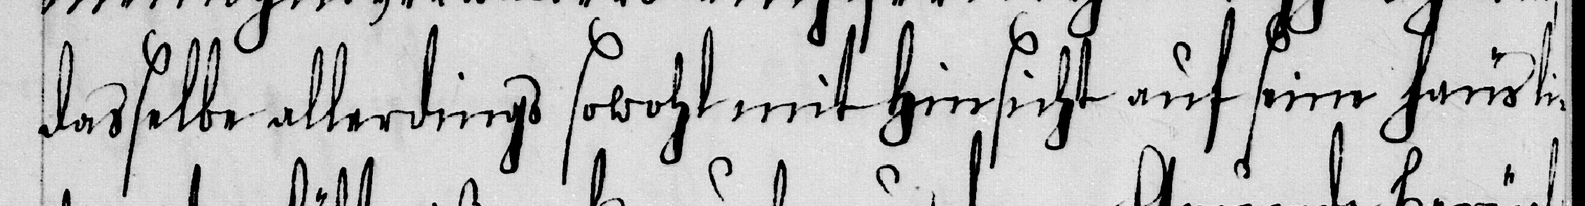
dasselbe allerdings sowohl mit Hinsicht auf seine Häusl¬
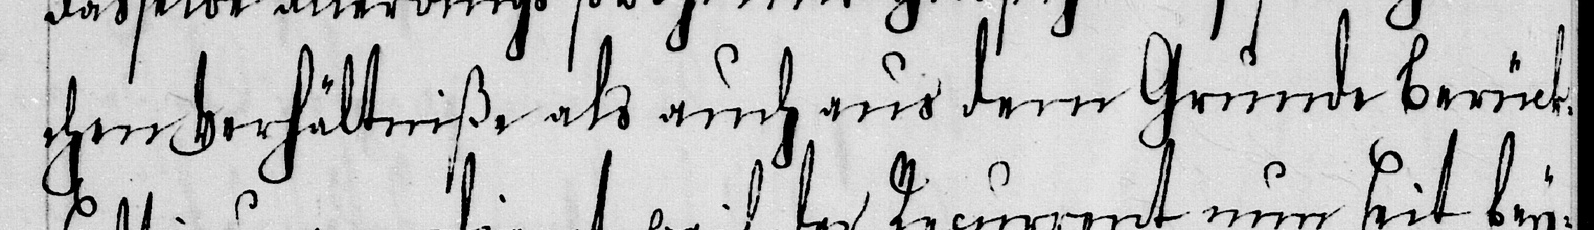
ichen Verhältniße als auch aus dem Grunde Berück¬
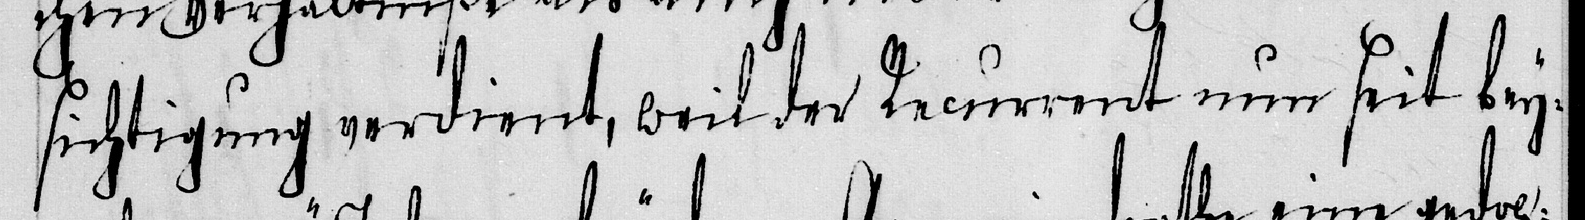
sichtigung verdient, weil der Recurrent nun seit bey¬
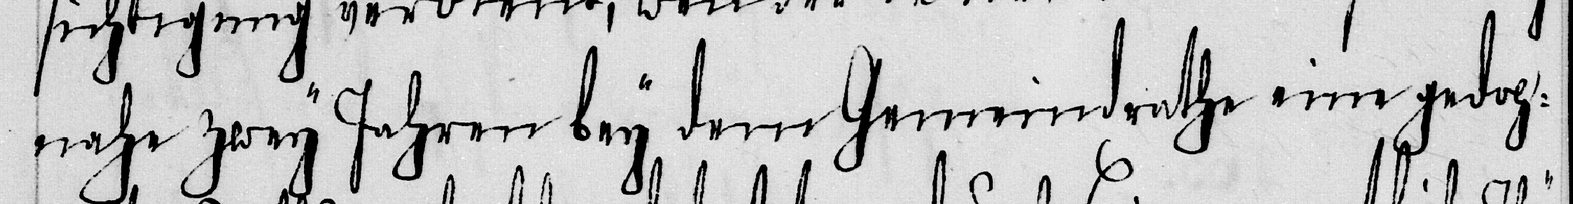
nahe zwey Jahren bey dem Gemeindrathe eine gedop¬
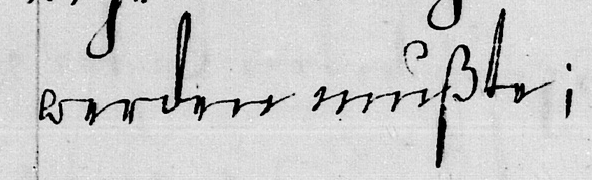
werden mußte;
